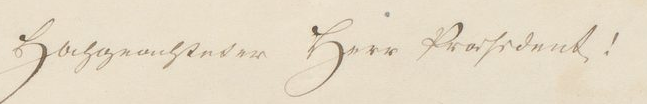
Hochgeachteter Herr Präsident!
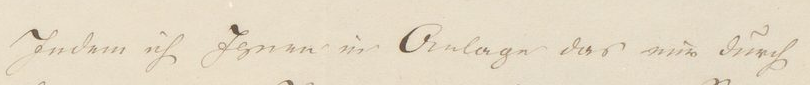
Indem ich Ihnen in Anlage das mir durch
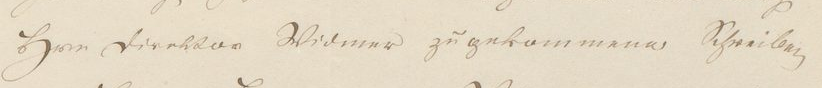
Hrn Direktor Widmer zugekommene Schreiben
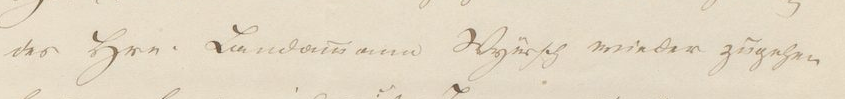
des Hrn. Landammann Wyrsch wieder zugehen
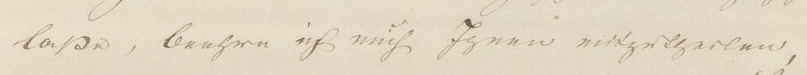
laße, beehre ich mich Ihnen mitzutheilen,
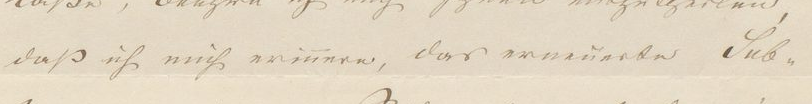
daß ich mich erinnere, das erneuerte Sub-
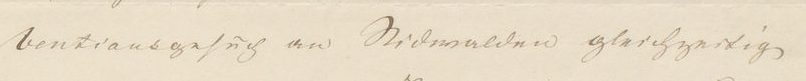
ventionsgesuch an Nidwalden gleichzeitig
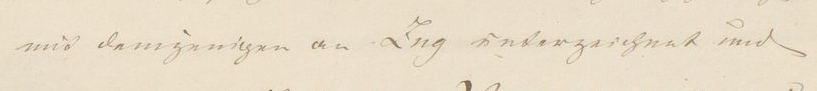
mit demjenigen an Zug unterzeichnet und
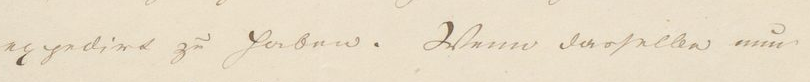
expedirt zu haben. Wenn dasselbe nun
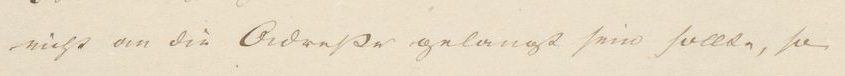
nicht an die Adreße gelangt sein sollte, so
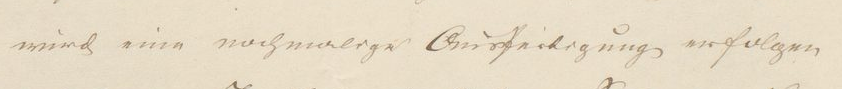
wird eine nochmalige Ausfertigung erfolgen
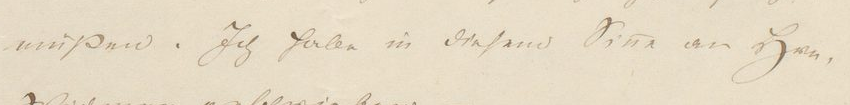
müßen. Ich habe in diesem Sinne an Hrn.
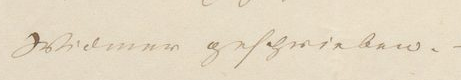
Widmer geschrieben. –
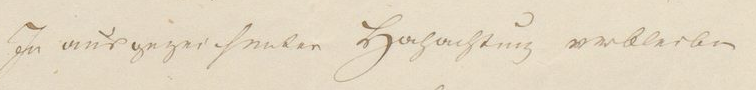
In ausgezeichneter Hochachtung verbleibe
